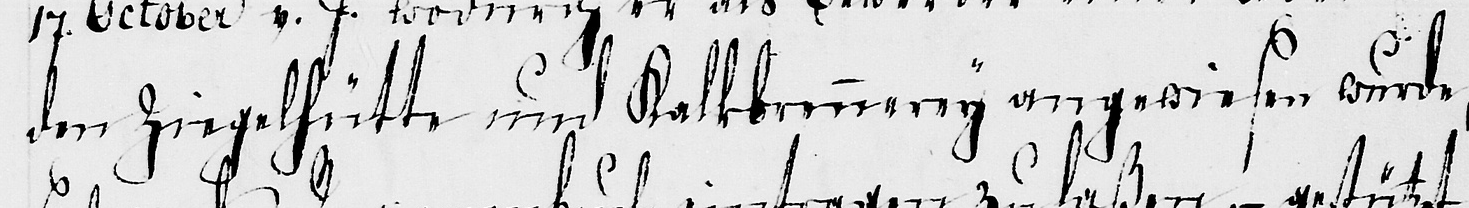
den Ziegelhütte und Kalkbrennerey angewiesen wurde,
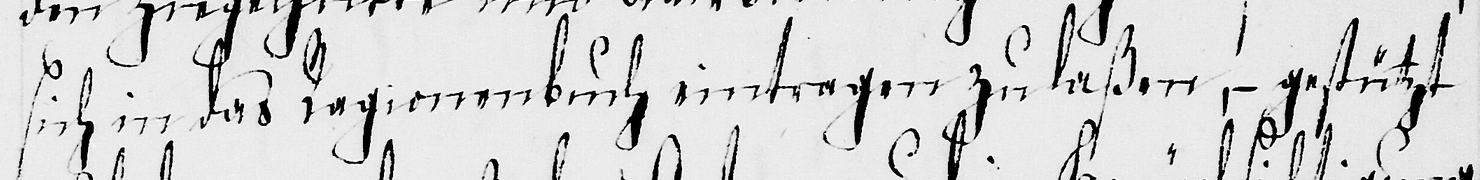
sich in das Ragionenbuch eintragen zu laßen, – gestützt
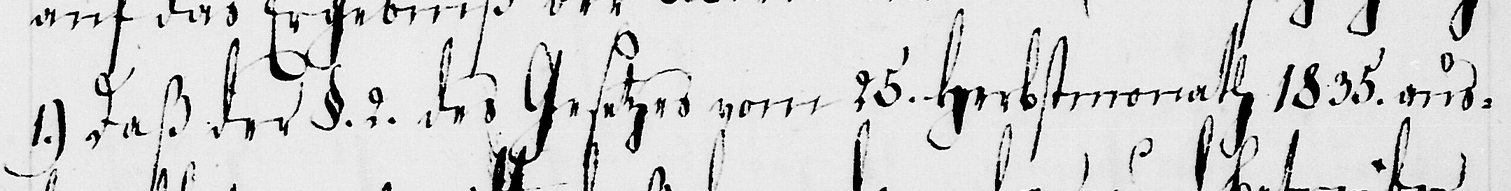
1.) Daß der §. 2. des Gesetzes vom 25. Herbstmonath 1835. aus¬
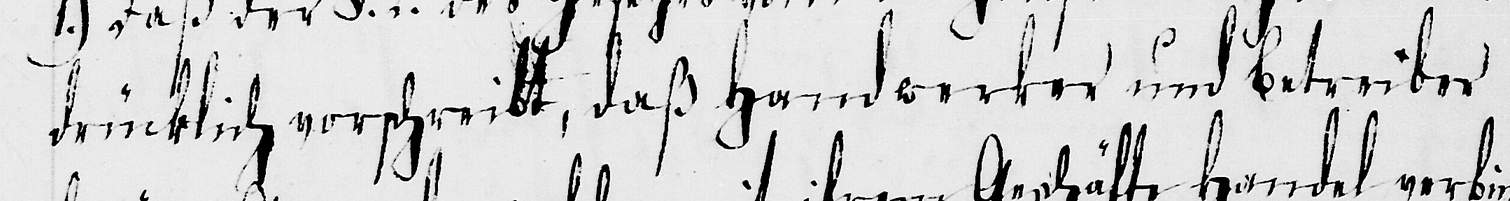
drücklich vorschreibt, daß Handwerker und Betreiber
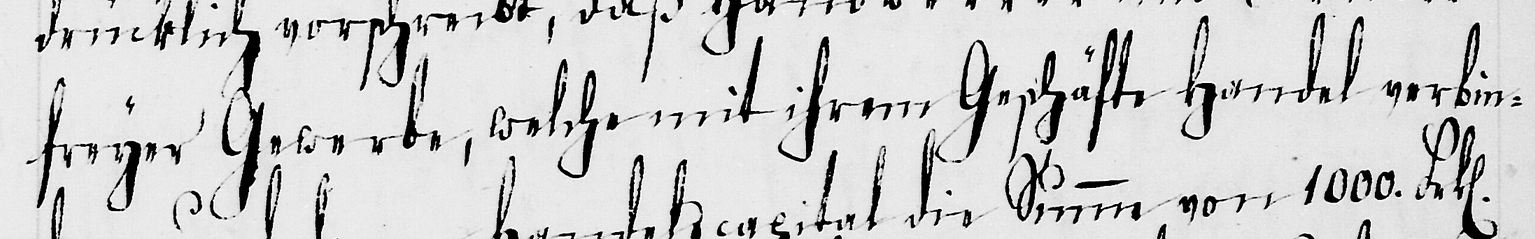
freyer Gewerbe, welche mit ihrem Geschäfte Handel verbin¬
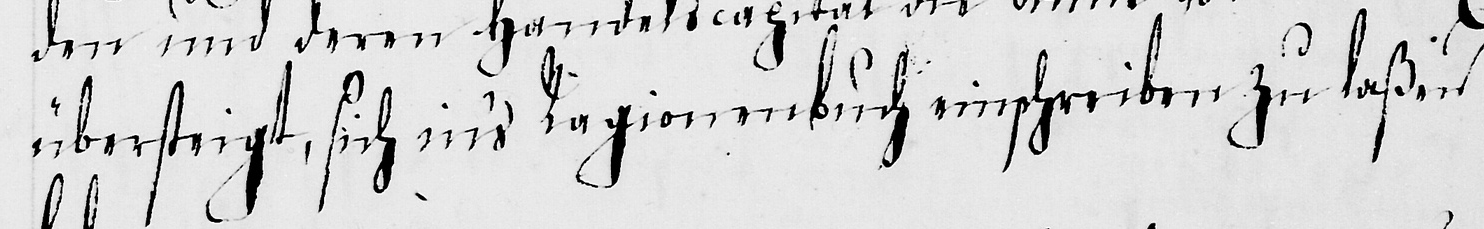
übersteigt, sich ins Ragionenbuch einschreiben zu laßen
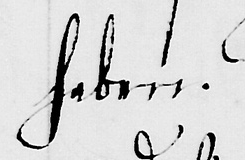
haben.
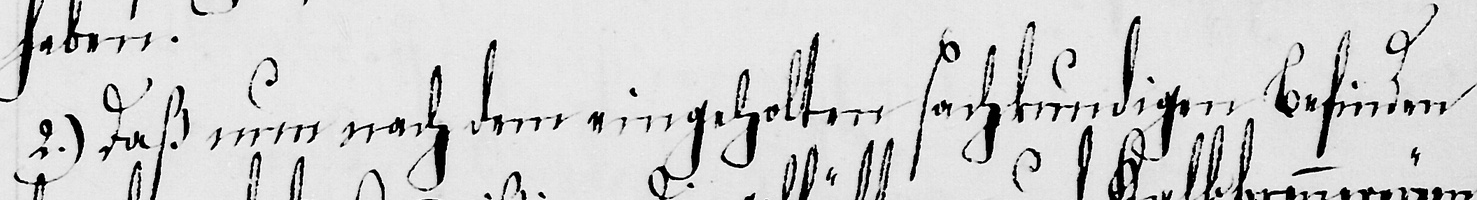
2.) Daß nun nach dem eingeholten sachkundigen Befinden
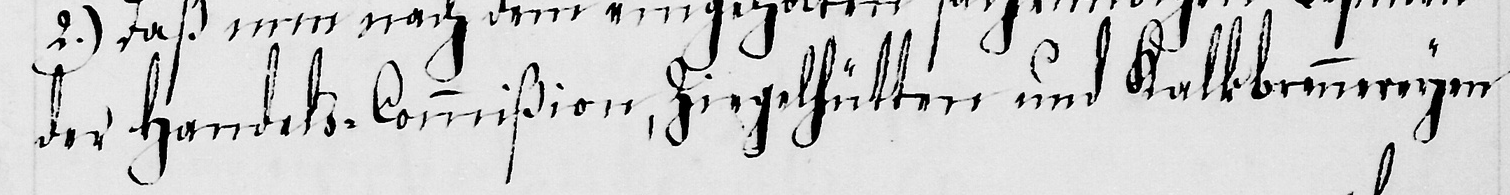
der Handels-Commißion, Ziegelhütten und Kalkbrennereyen
